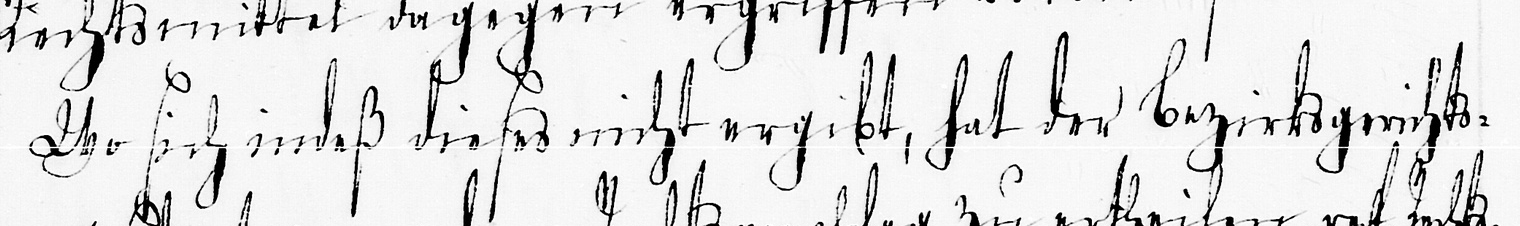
Wo sich indeß dieses nicht ergibt, hat der Bezirksgerichts¬
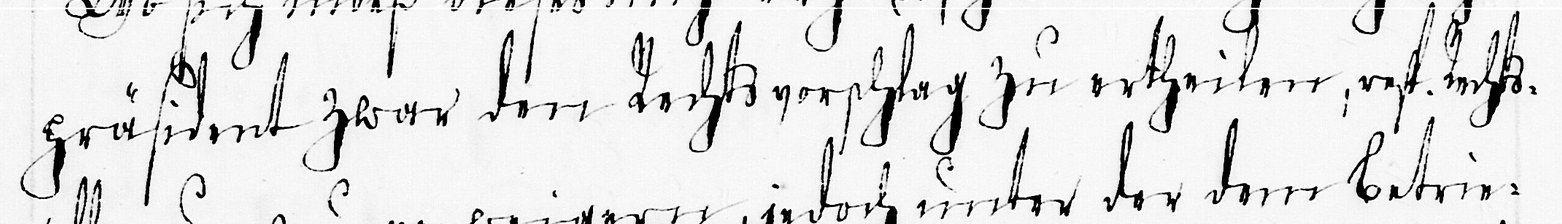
präsident zwar den Rechtsvorschlag zu ertheilen, resp. Rech¬
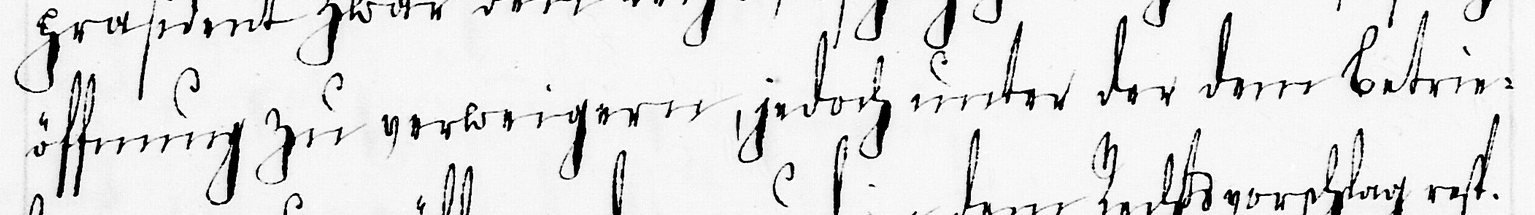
öffnung zu verweigern, jedoch unter der dem Betrie¬
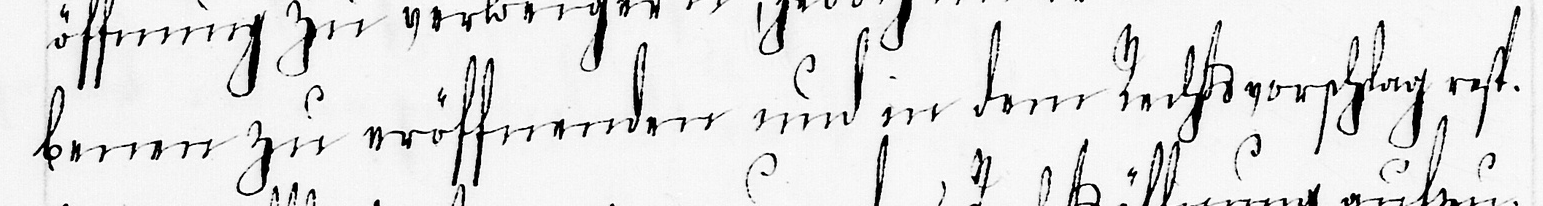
benen zu eröffnenden und in dem Rechtsvorschlag res¬
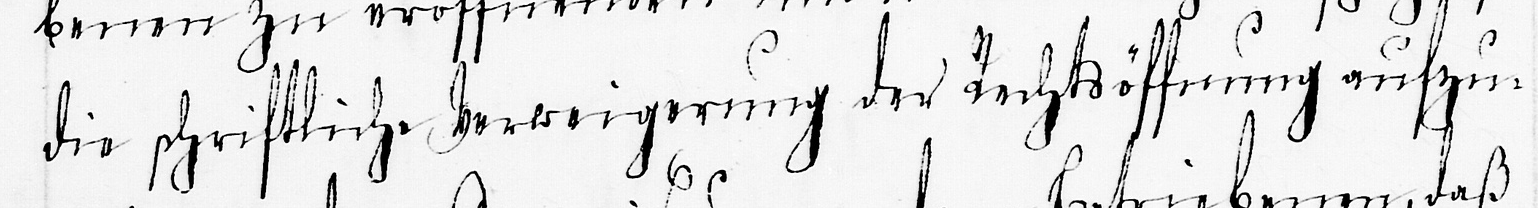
die schriftliche Verweigerung der Rechtsöffnung aufzu¬
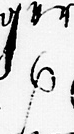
p.
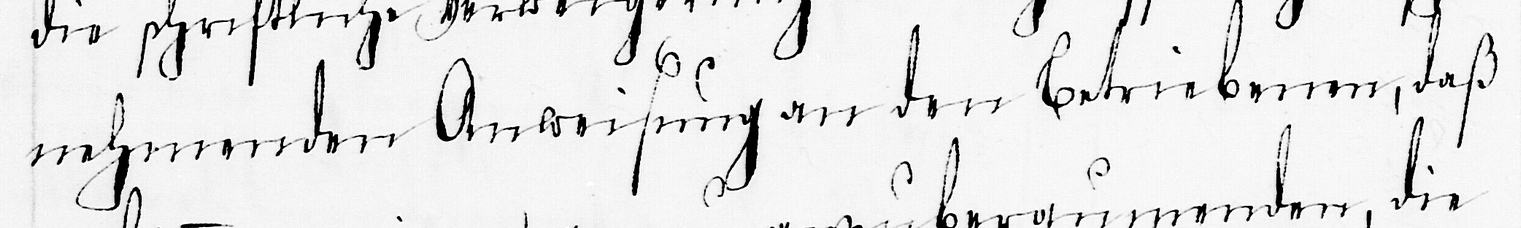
nehmenden Anweisung an den Betriebenen, daß
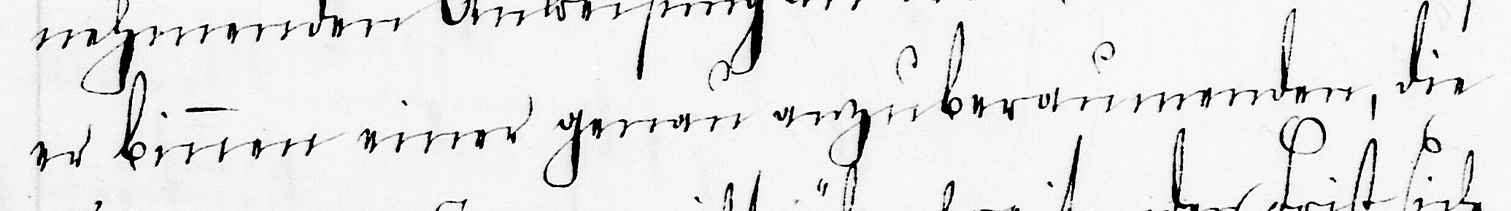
er binnen einer genau anzuberaumenden, die
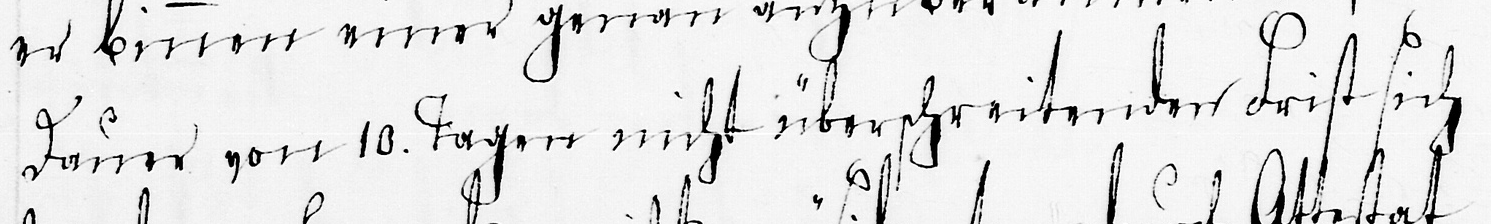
Dauer von 10. Tagen nicht überschreitenden Frist sich
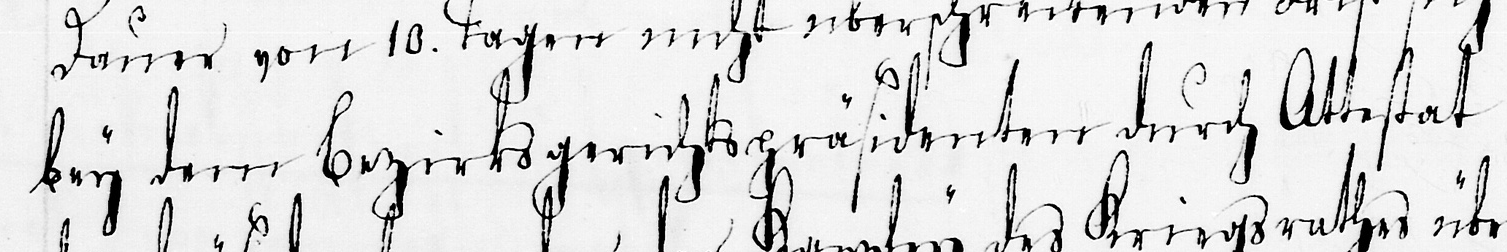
bey dem Bezirksgerichtspräsidenten durch Attestat
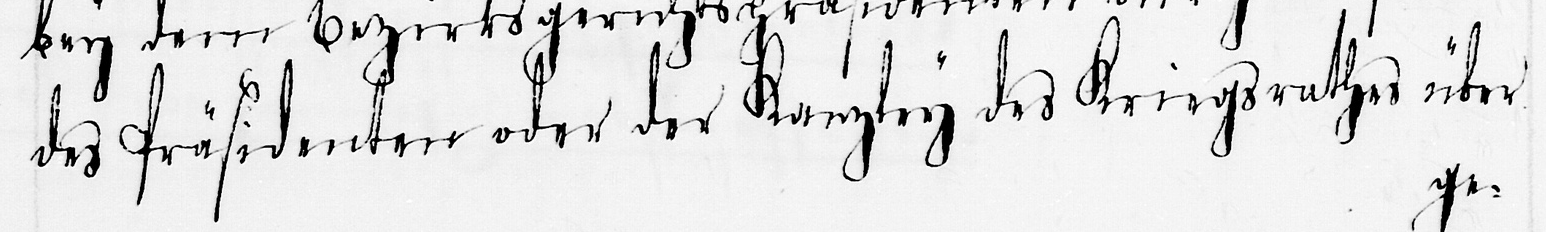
des Präsidenten oder der Kanzley des Kriegsrathes über
